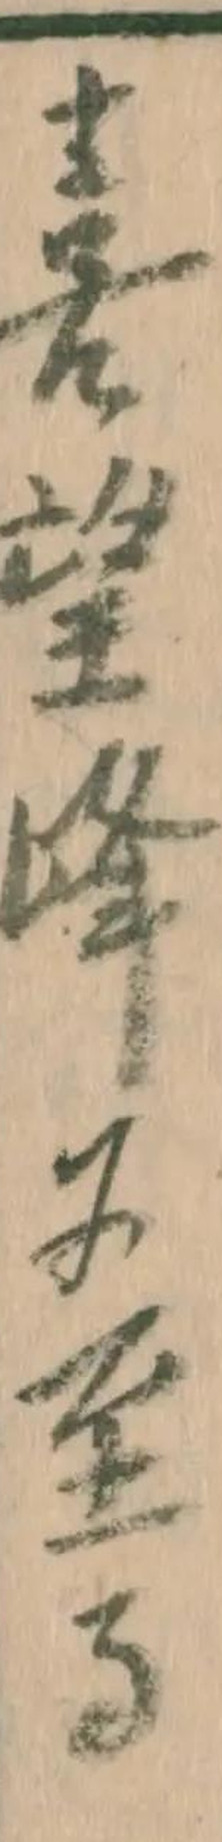喜望峰に至る
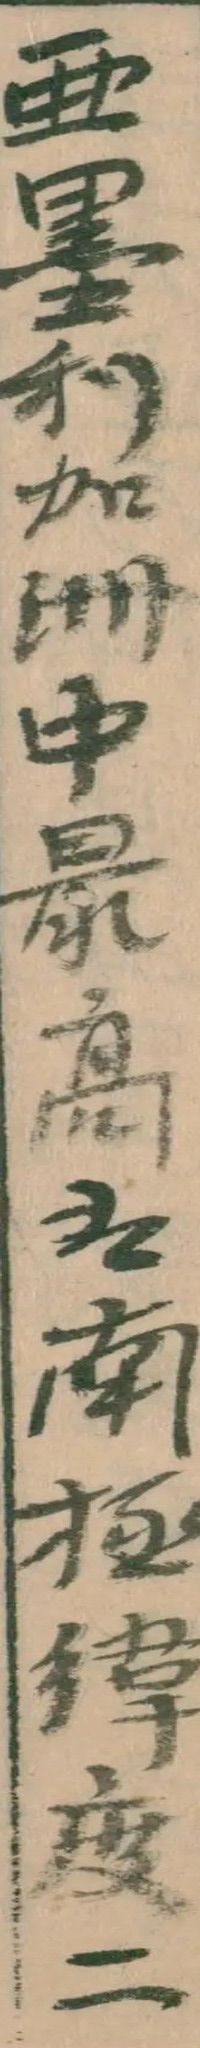亜墨利加洲中最高は南極緯度二
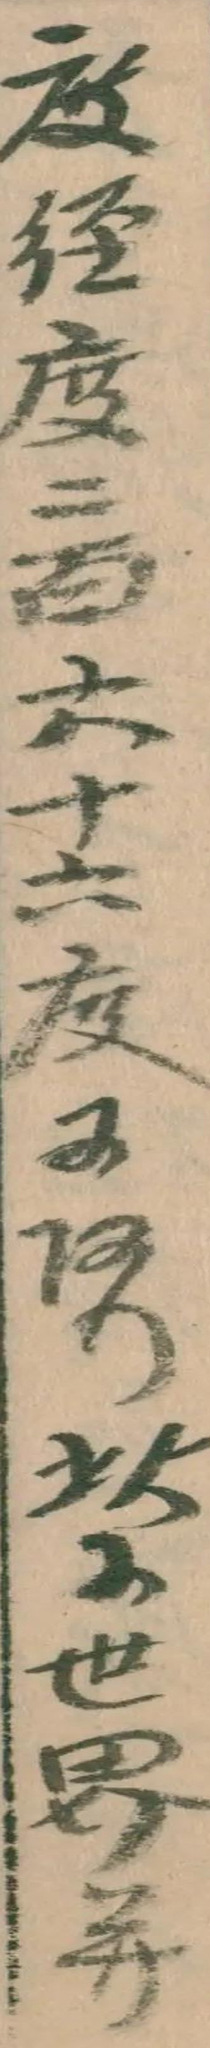度経度二百六十六度にあり此に世界并
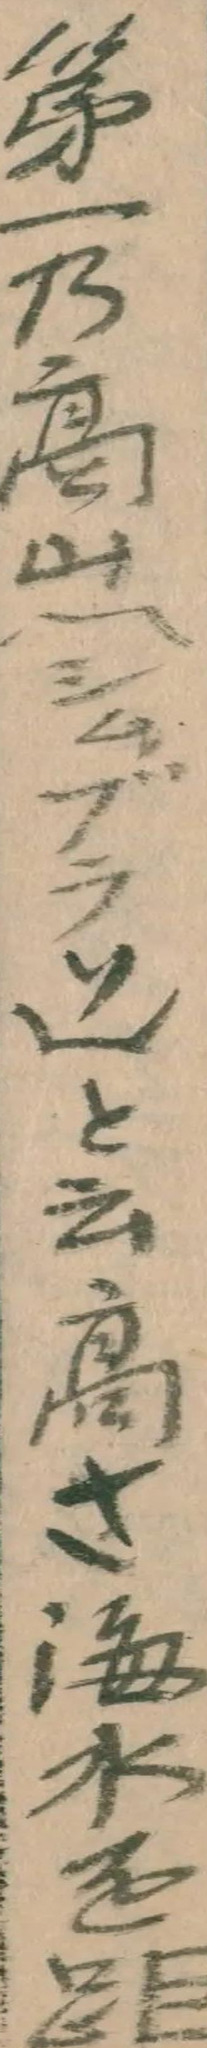第一の高山(シムブラソ)と云高さ海水を距
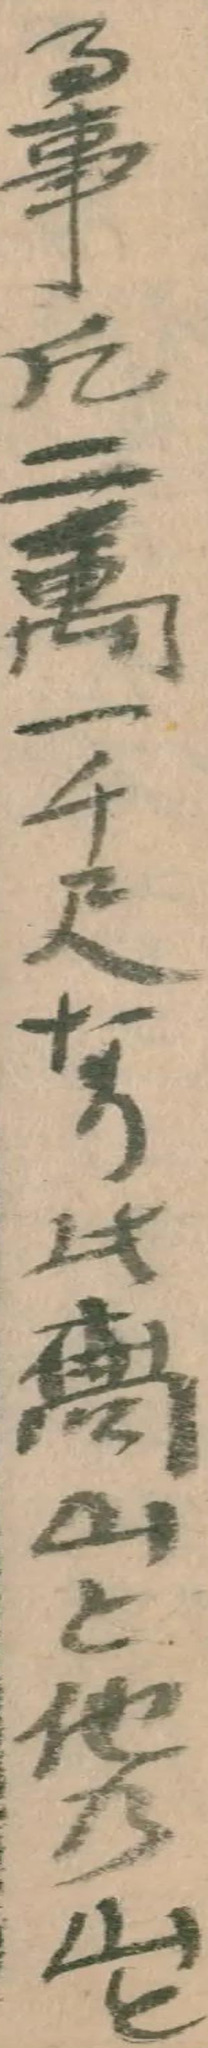る事凡二万一千尺なり此高山と他の山と
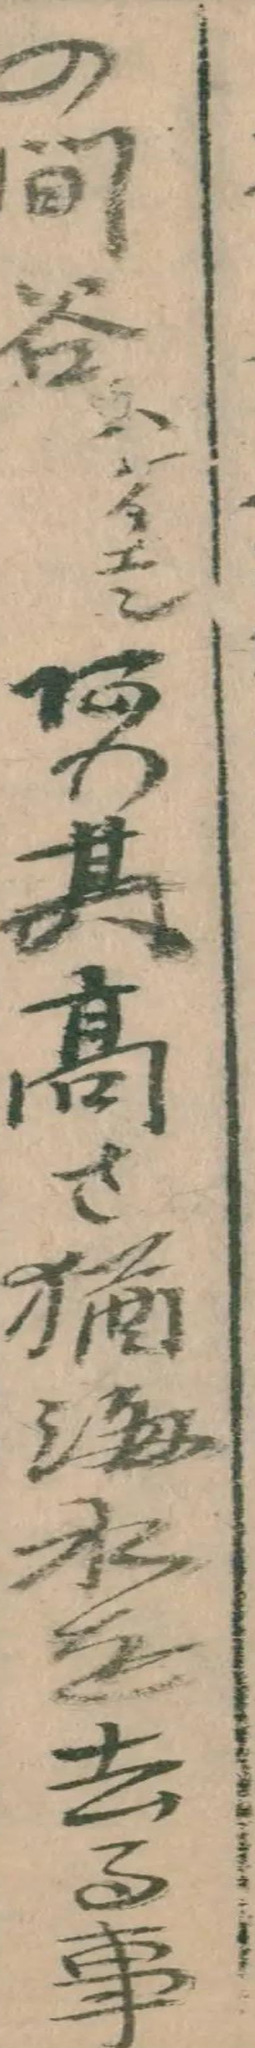の間谷ハレイエンあり其高さ猶海水を去る事
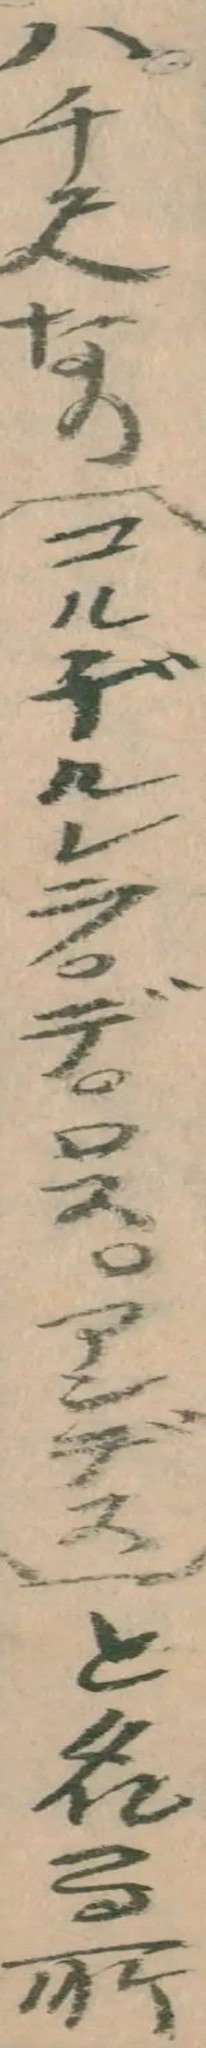八千尺なり(コルヂルレラ・デ・ロス・アンデス)と名る所

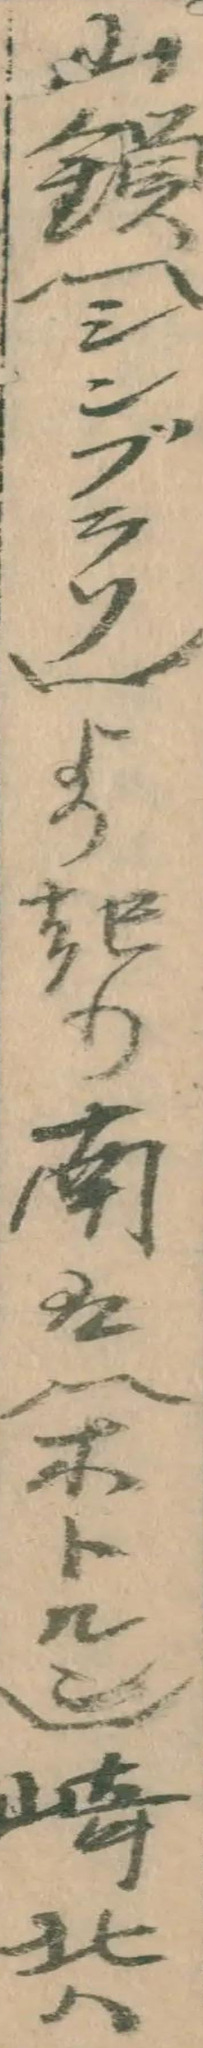山鎖(シンブラソ)より起り南は(ホトルン)崎北は
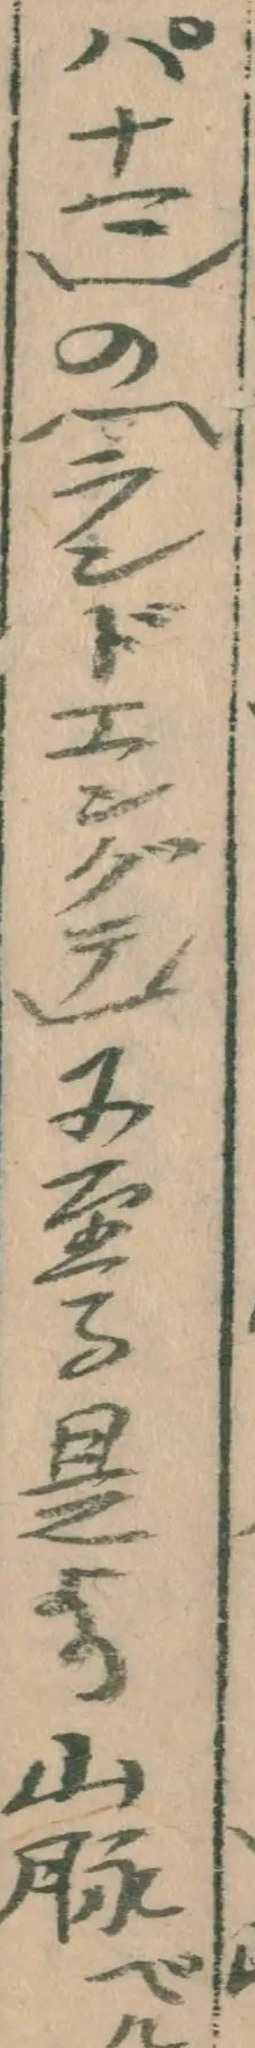パナマ)の(ランドエングテ)に至る是より山脈ベルグシ
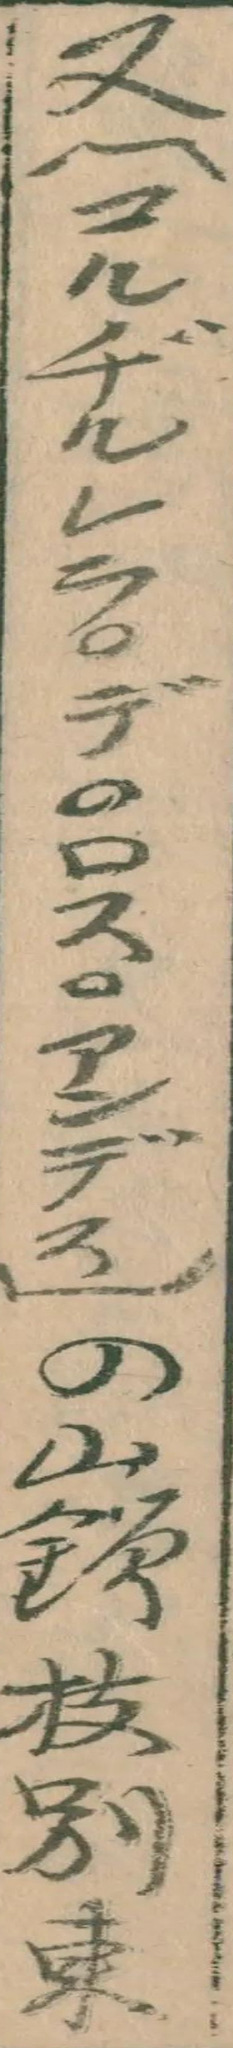又(コルヂルレラ・デ・ロス・アンデス)の山鎖枝別東
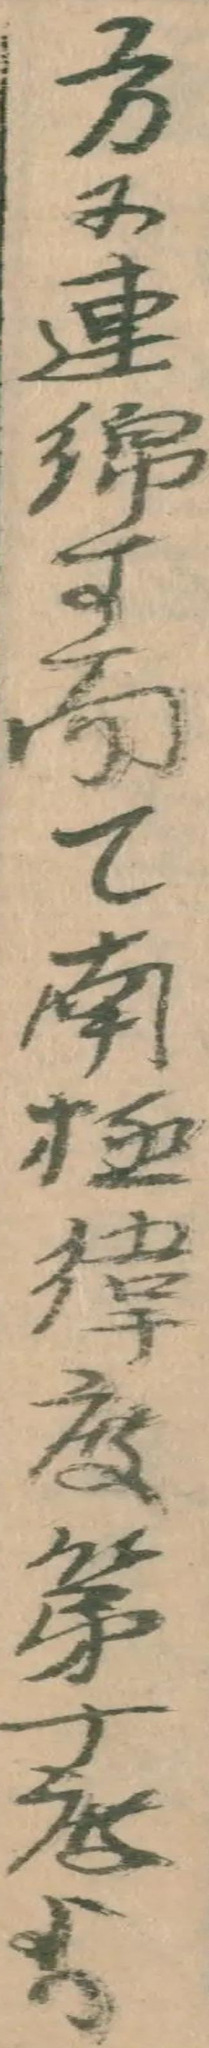方に連綿す而て南極緯度第十度より
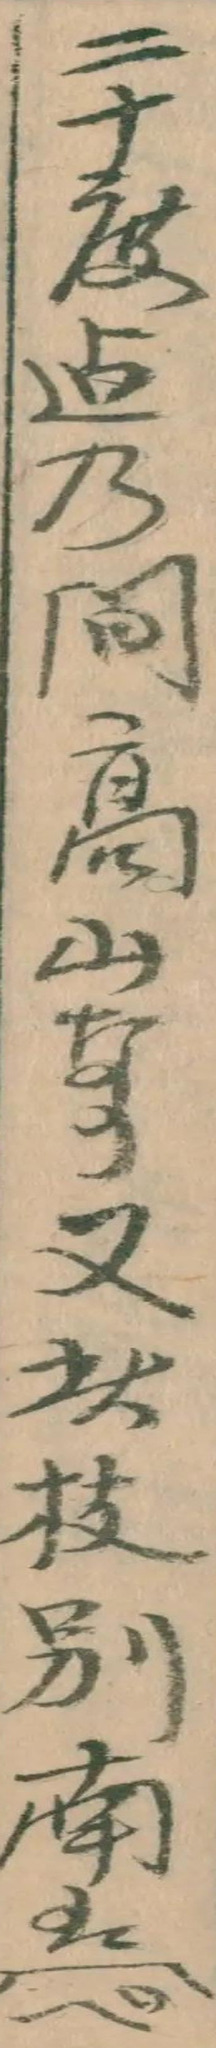二十度迠の間高山なり又此枝別南は(ペ
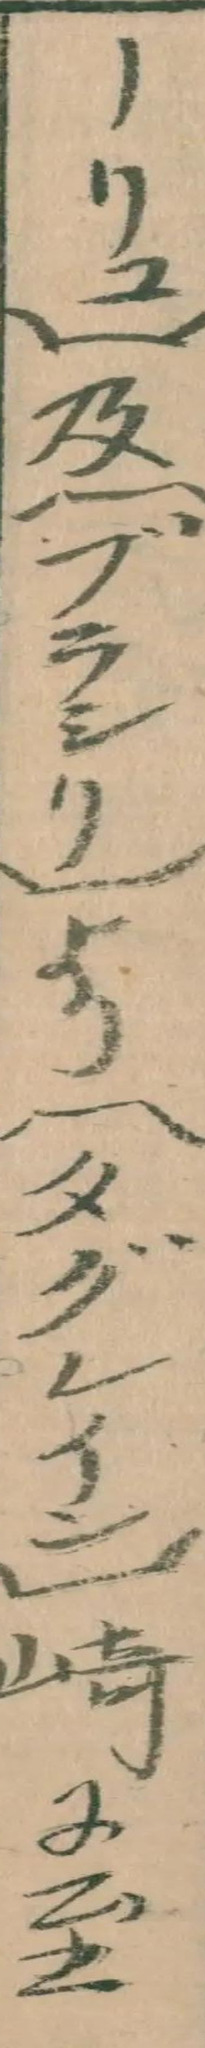ーリュ)及(ブラシリ)より(タグレイン)崎に至
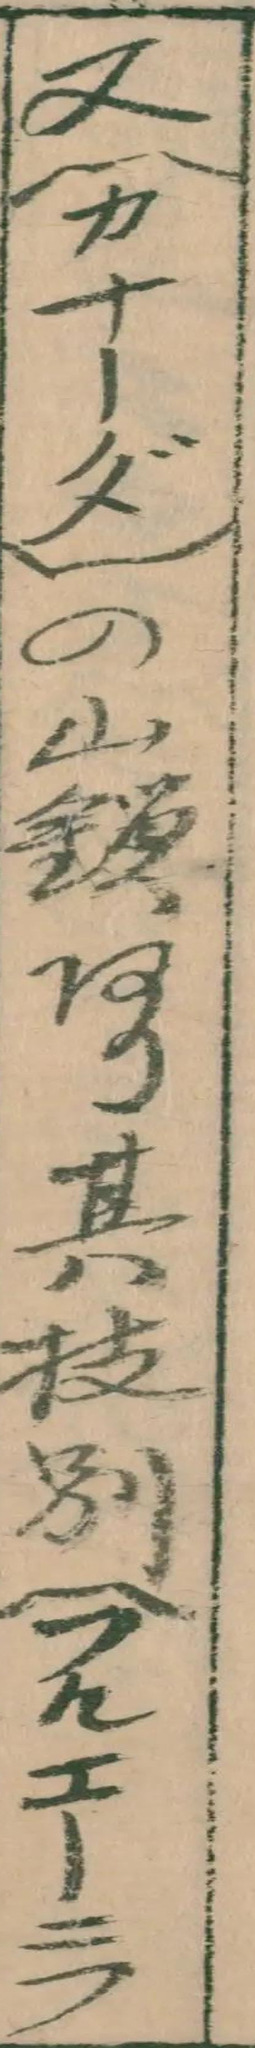又(カナーダ)の山鎖あり其枝別(フルエーニフ
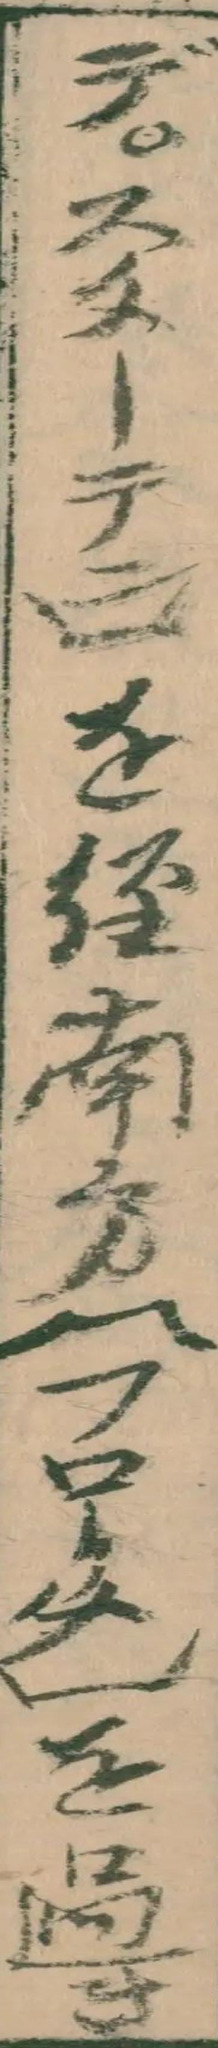デ・スターテン)を経南方(フロリタ)を過き
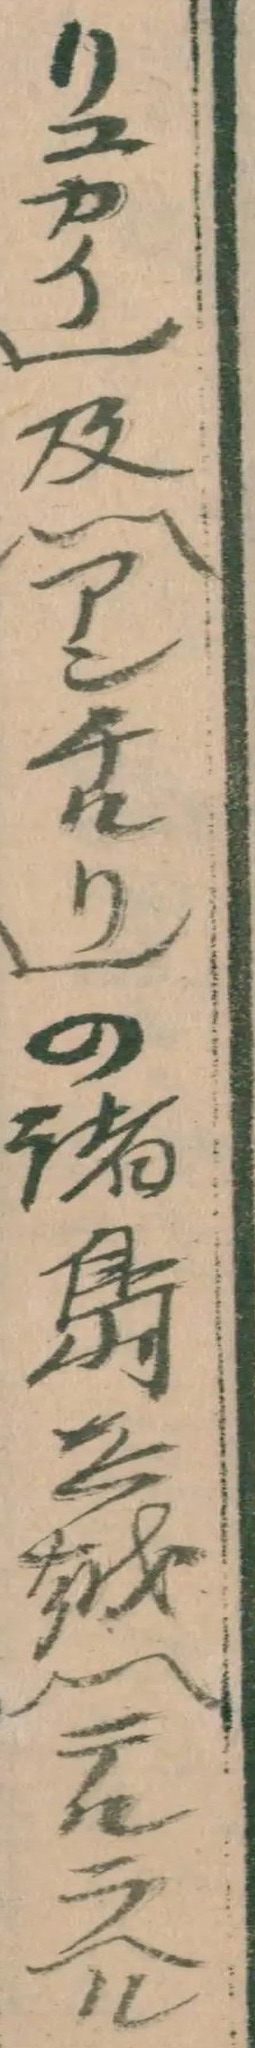リユカイ)及(アンチルリ)の諸島を越(テルラヘル
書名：新釈輿地図説
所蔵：国立国会図書館 National Diet Library, JAPAN
